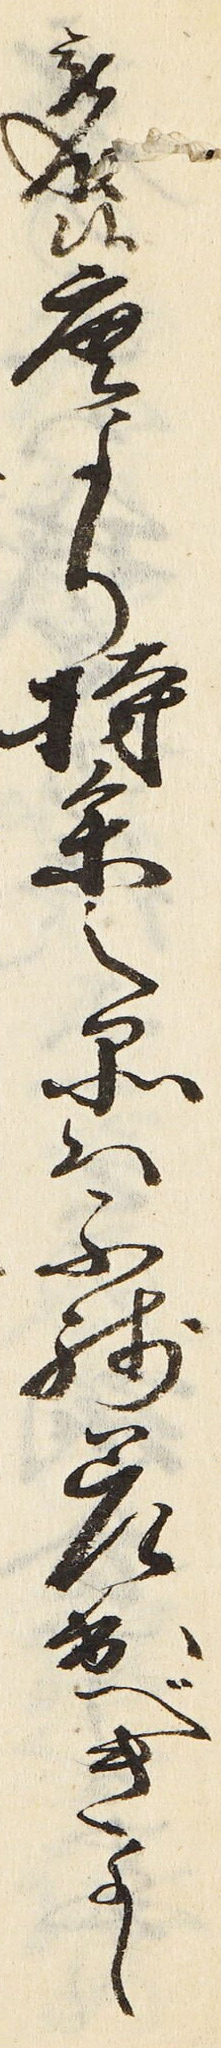被成候唐より持参之品ハ不残差出べきよし
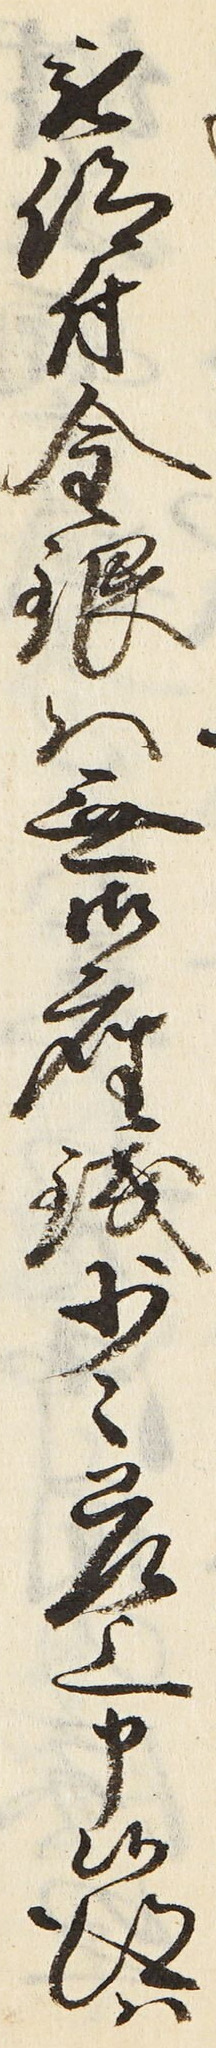被仰付金銀ハ無御座銭少々差上申候後ハ
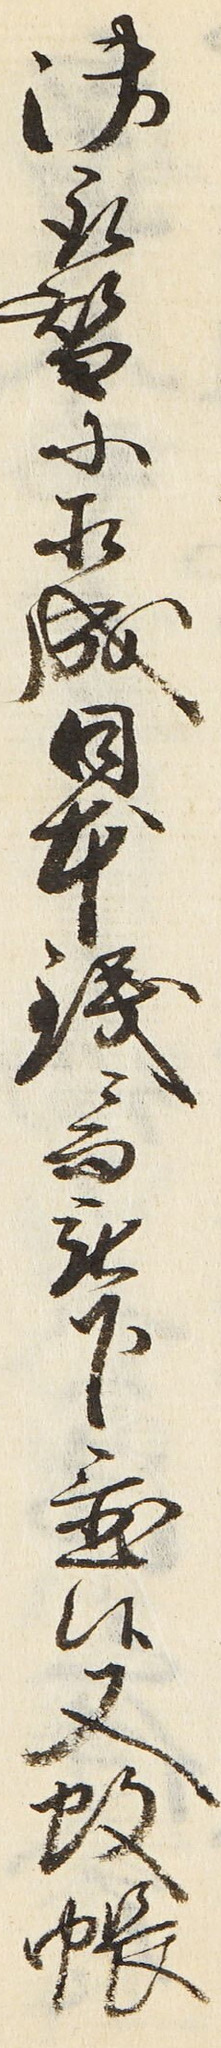御取替に相成日本銭ニ而被下置候又蚊帳
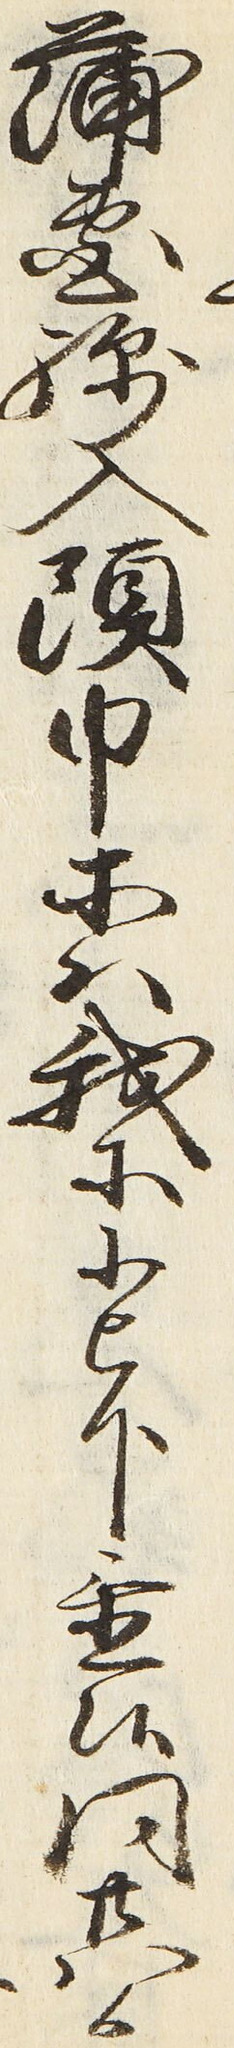蒲団綿入頭巾等ハ我等に被下置候同廿八日
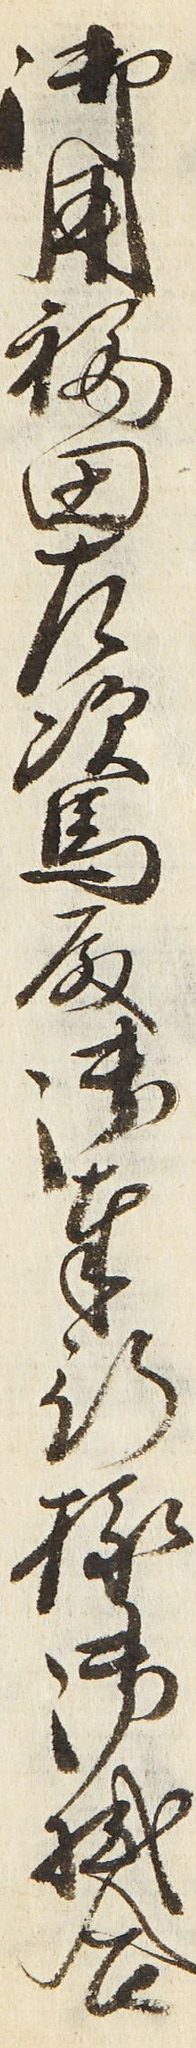御用福田左次馬殿御奉行様御掛合
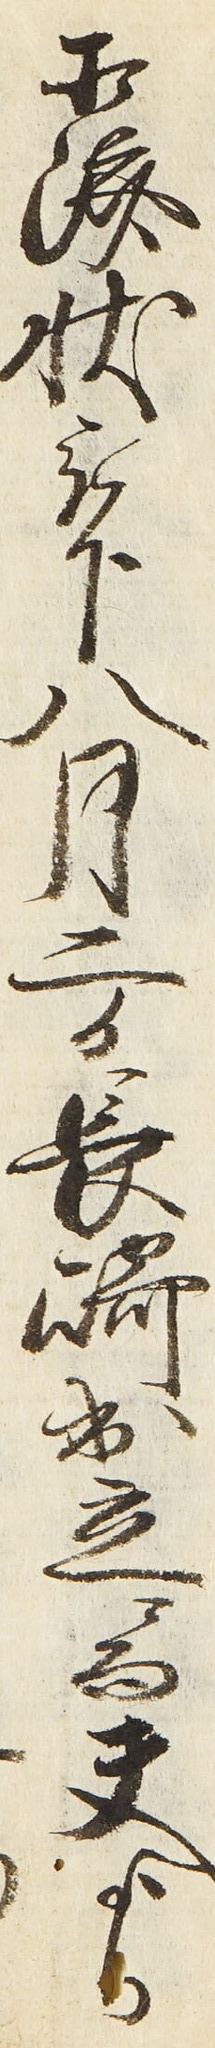相済状被下八月二日長崎出立ニ而夫より
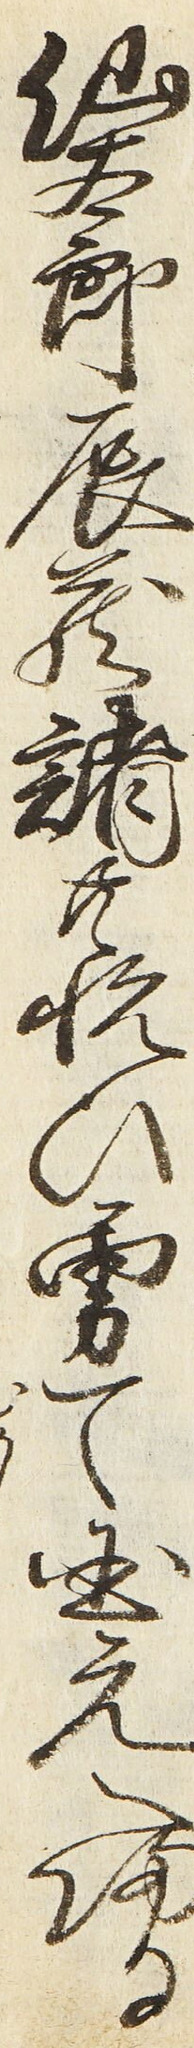仙太郎辰蔵諸共悦ひ勇て国元へ帰る
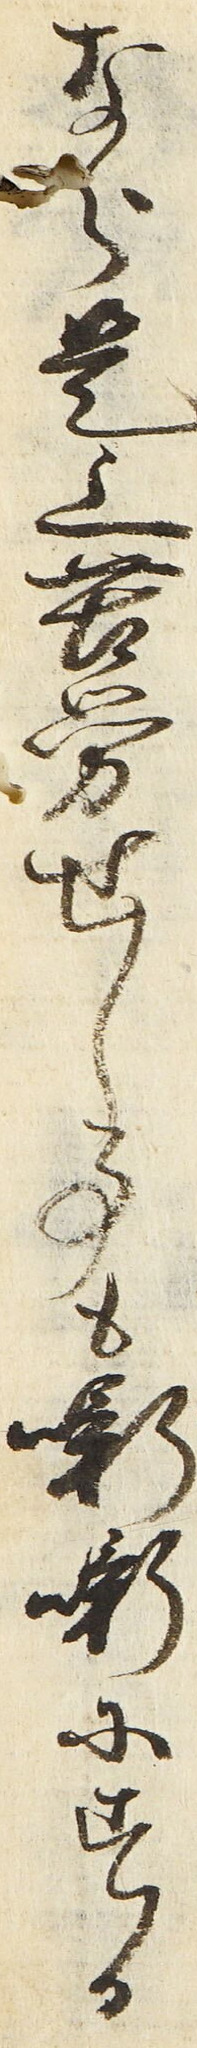なら是上苦労せし事も噺噺にする

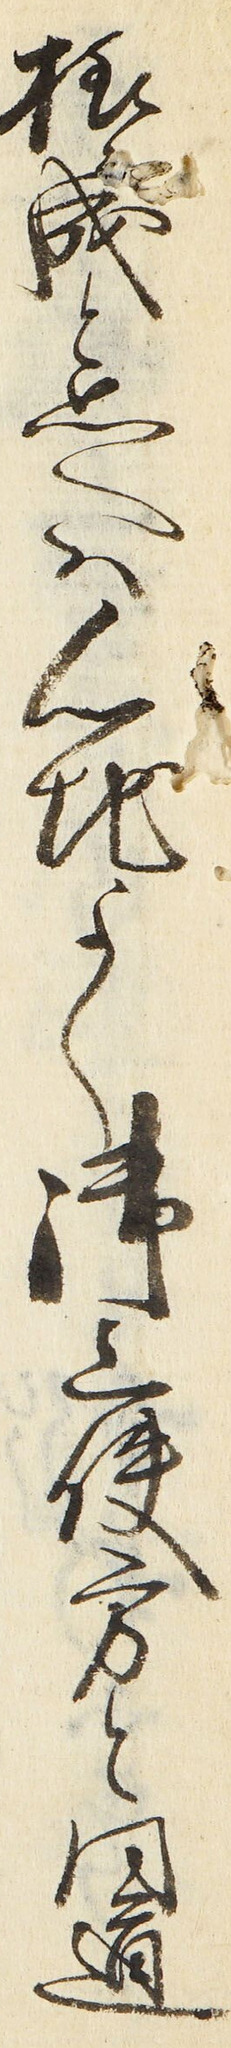様ニ成と思へハ心地よく御上使方と同道
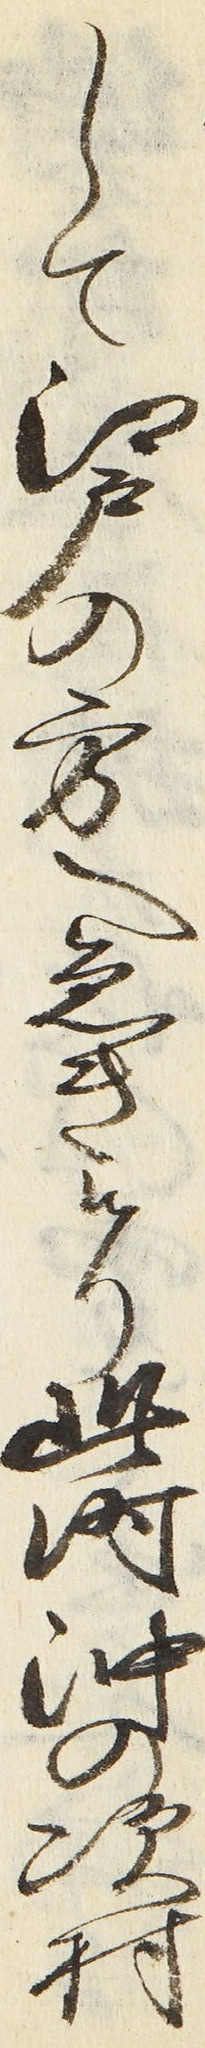して江戸の方へ急きけり此時沖の次村
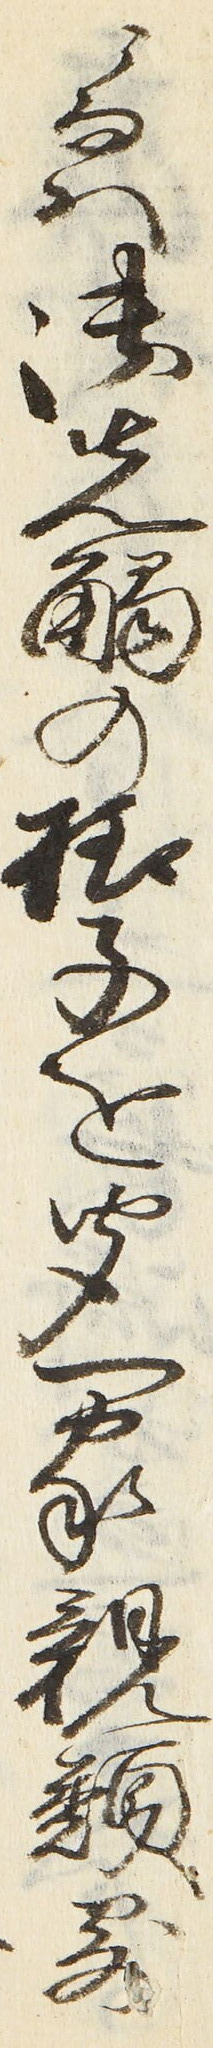ニ而ハ御先触の様子を聞一家親類寄
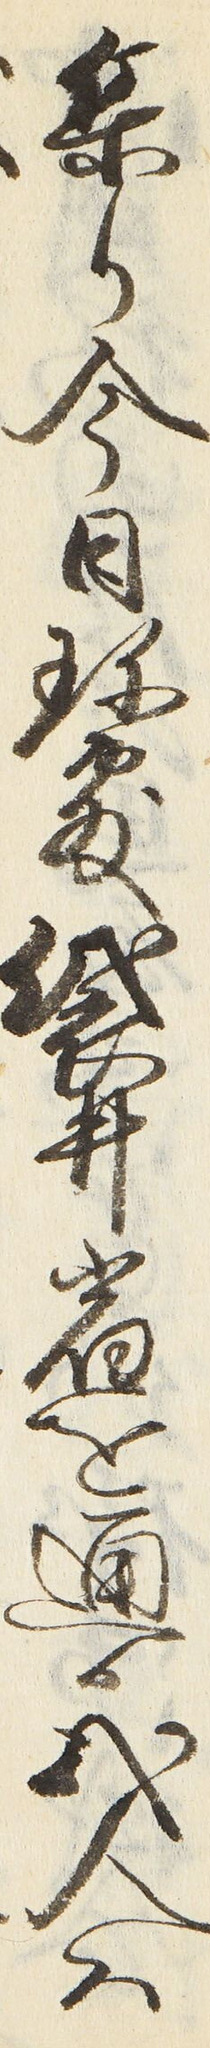集り今日珍敷袋井宿を通る弐人ハ
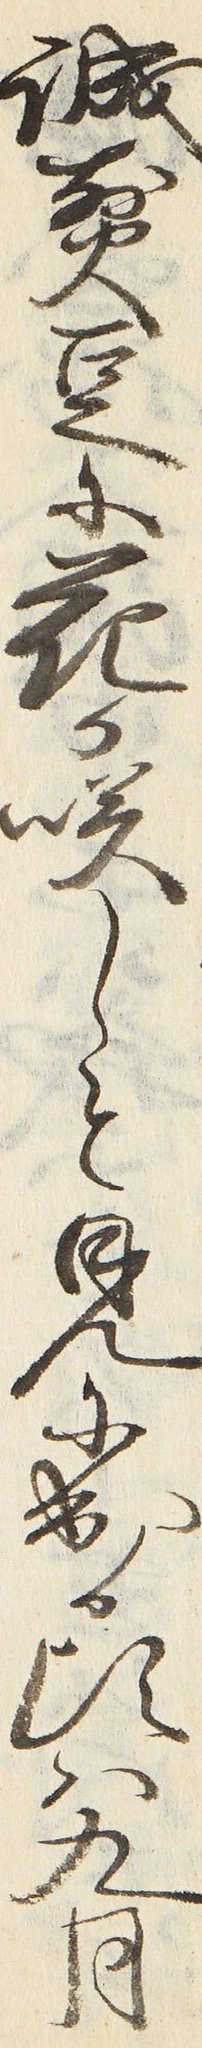誠煎豆に花か咲しと見に出る頃ハ九月
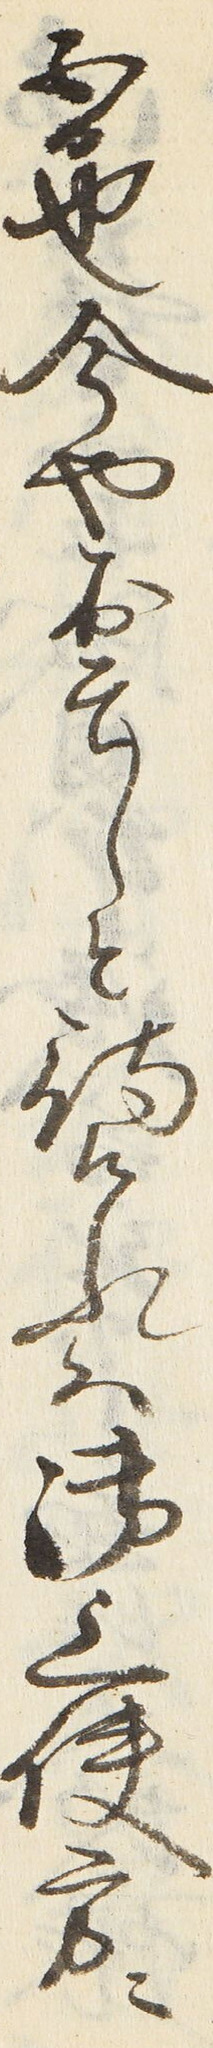五日也今やおそしと待けれハ御上使方に
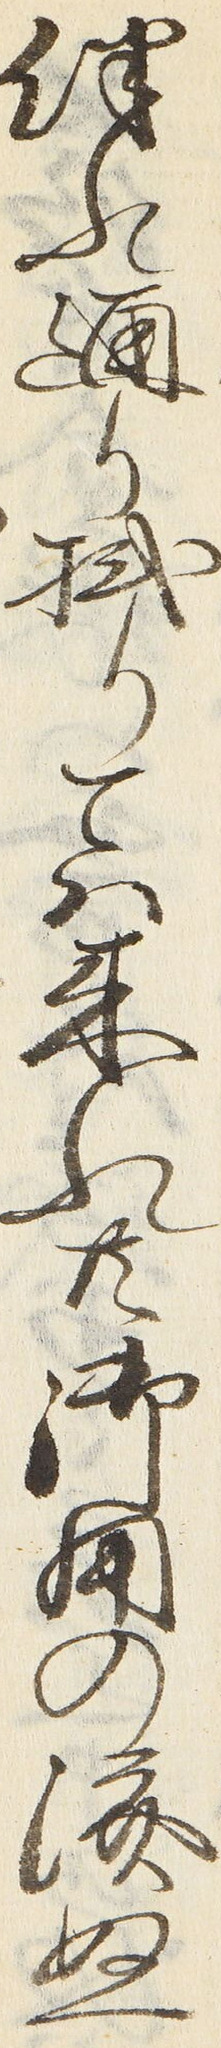伴れ通り掛りてハ来れ共御用の済ぬ
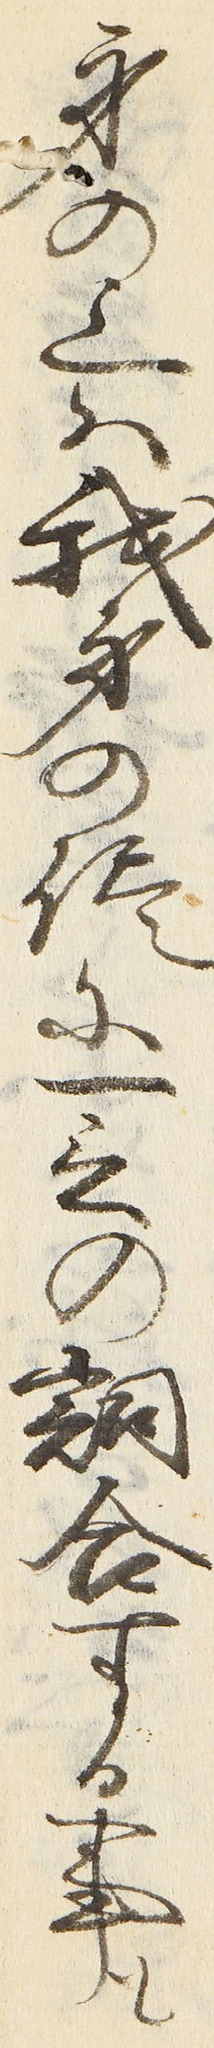身の上ハ我身の侭に一云の詞合する事も
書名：天保漂流記
